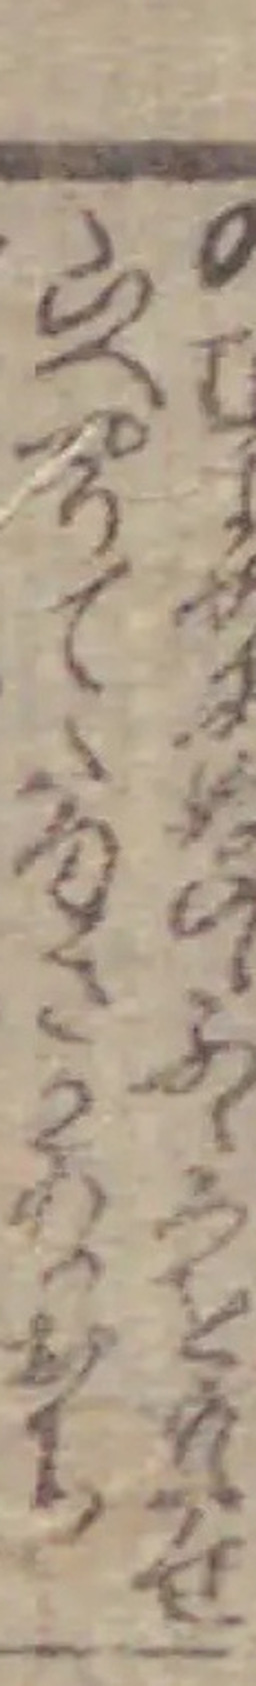山へやりてたまさかあるおち
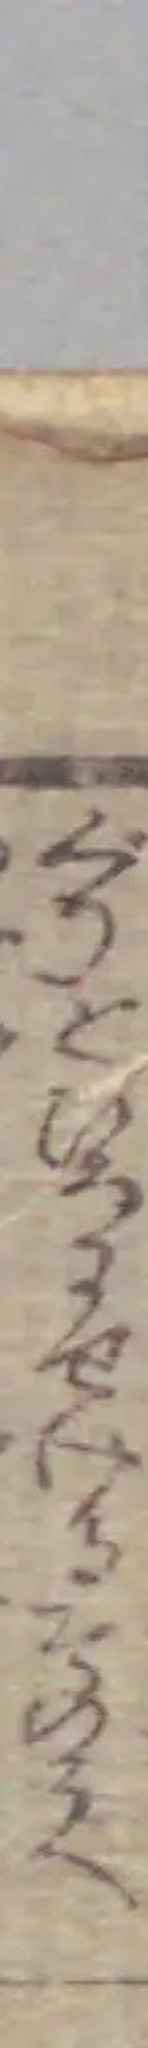ぐりをひろわせけるそのうへ
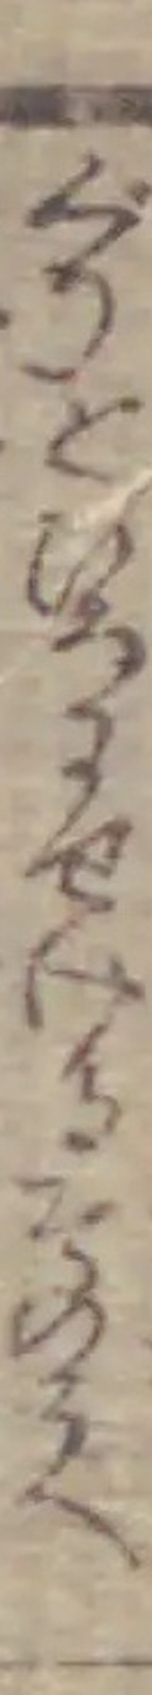ぐりをひろわせけるそのうへ
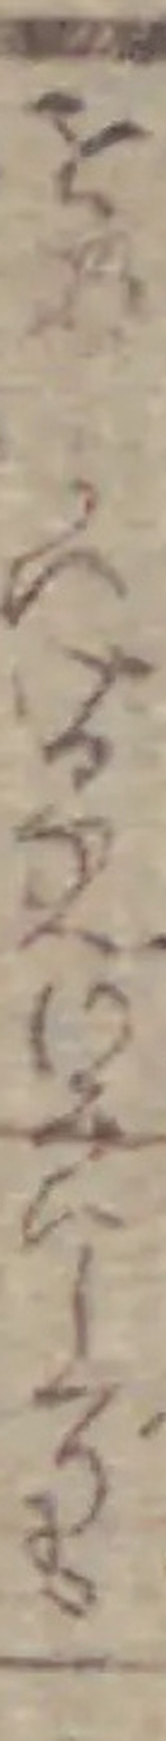をあいけるゆへひろひしくりも
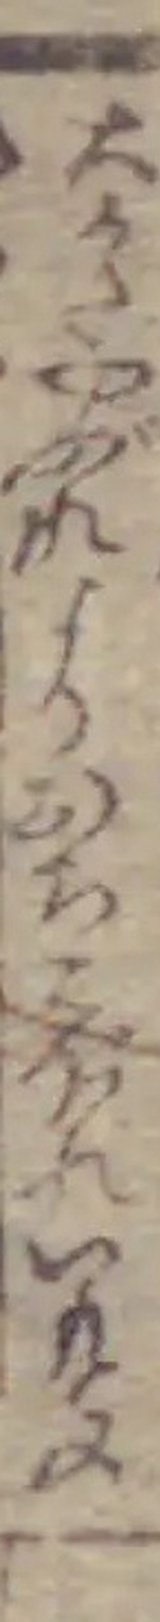大かたやぶれよりおちこぼれいもとの
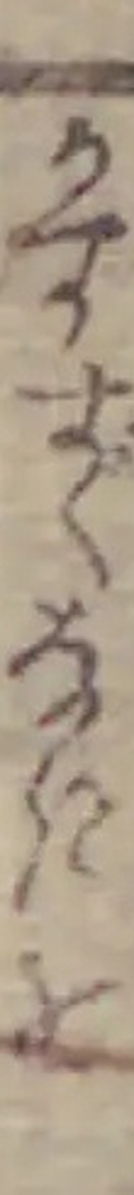かすすくなきを
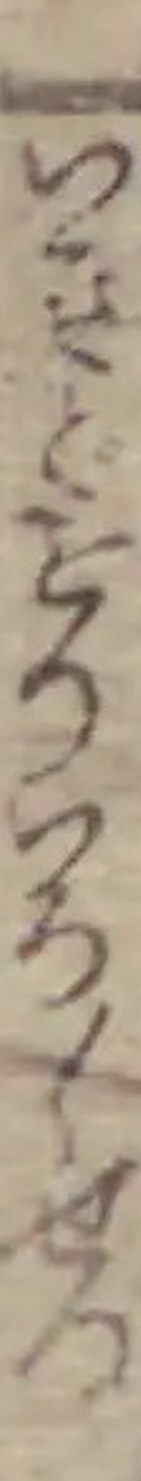いきどをりいろゝせつ
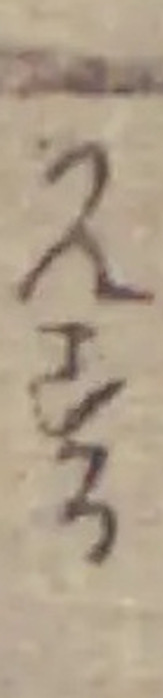かんする
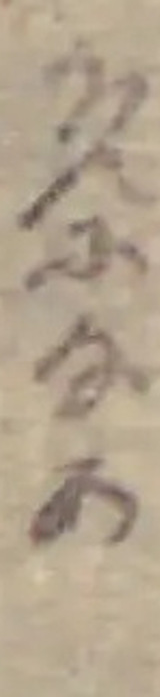ほんになあ
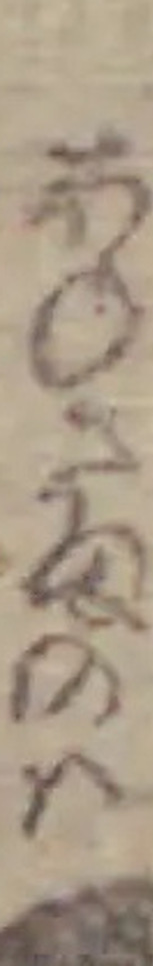あねさまのは
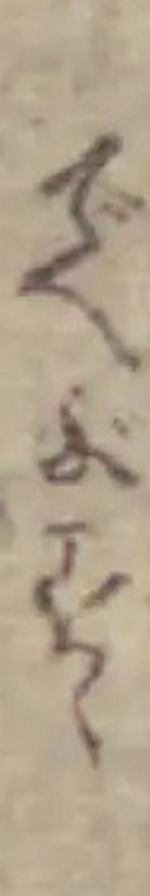でへぶすて
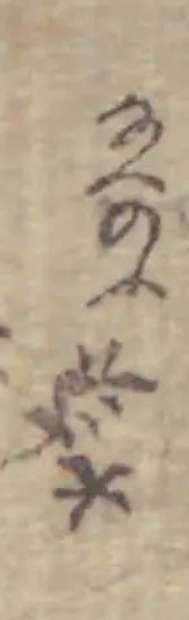なへのふ
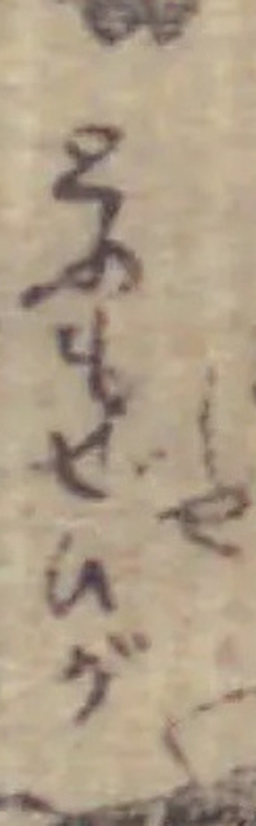とふもぜひが
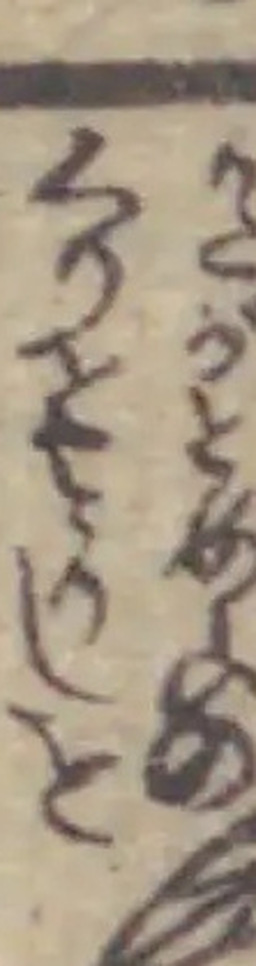くりをとりしを
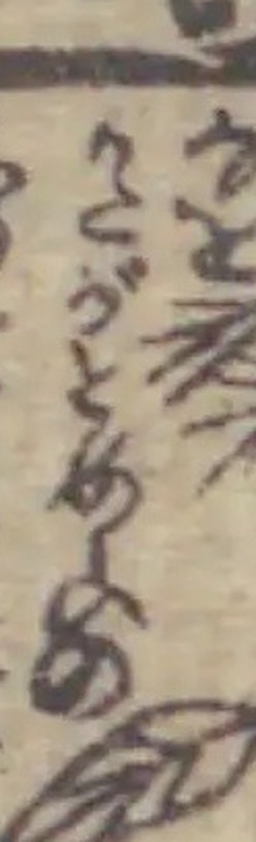かたがとめ山の
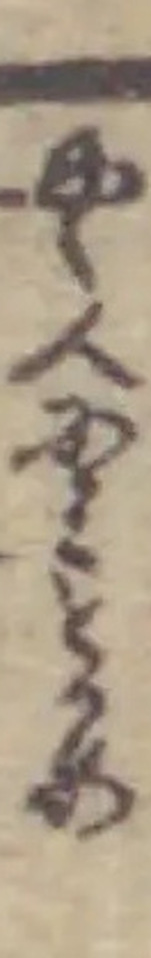やく人にみとかめ
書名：奥州咄 3巻
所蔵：国立国会図書館 National Diet Library, JAPAN
